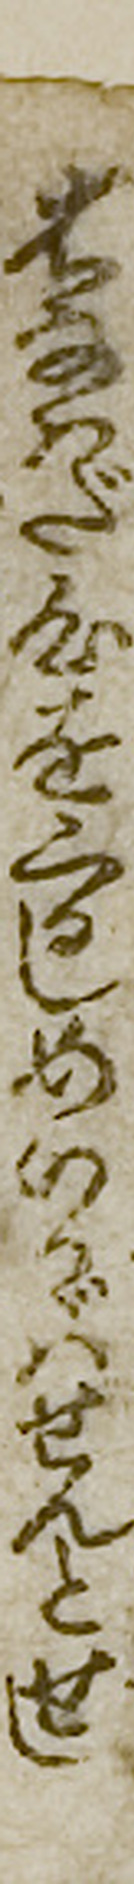はなはだ心をくるしめいかゞはせんとせし
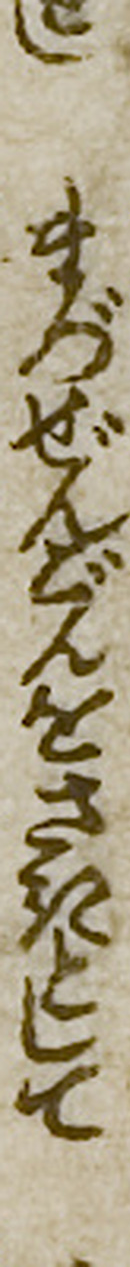まづぜんごんをさきとして
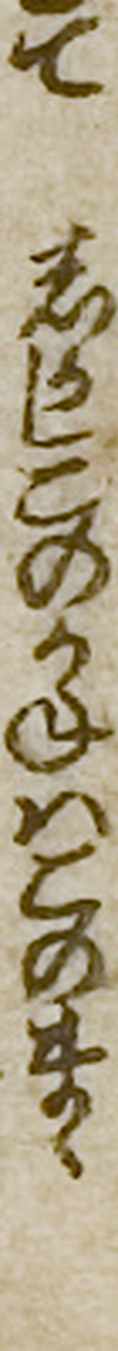しかしこのかねはこのまゝ
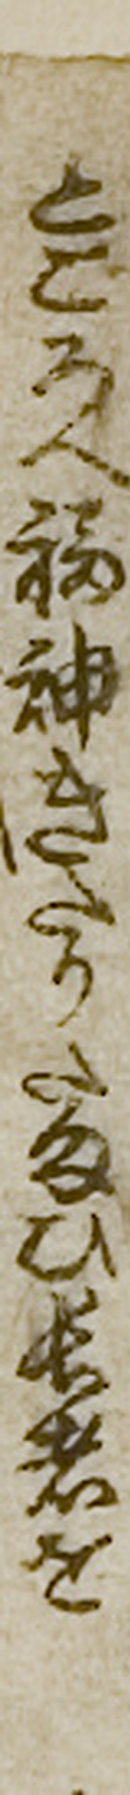ところへ福神きたりたまひ長者を
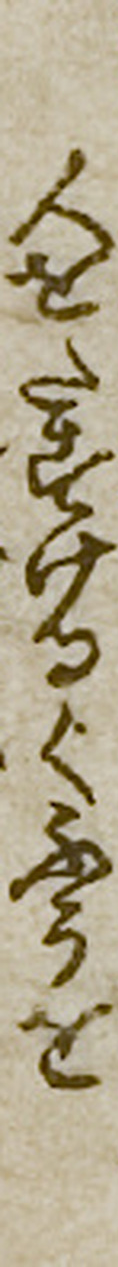人をたすけるくふうを
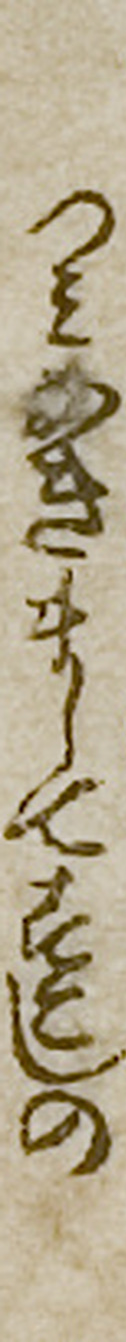つみおきましてすこしの
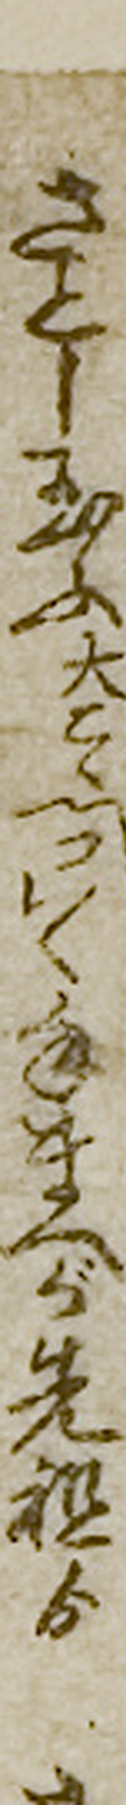さとし玉ふ大こく〽これ〳〵手まへが先祖より
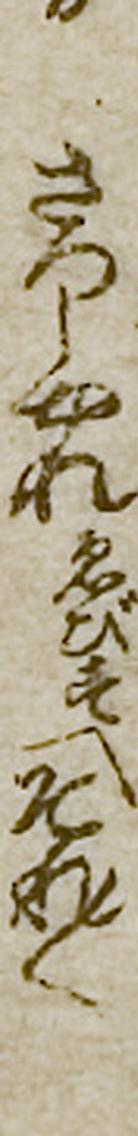さつしやれゑびす「それ〳〵
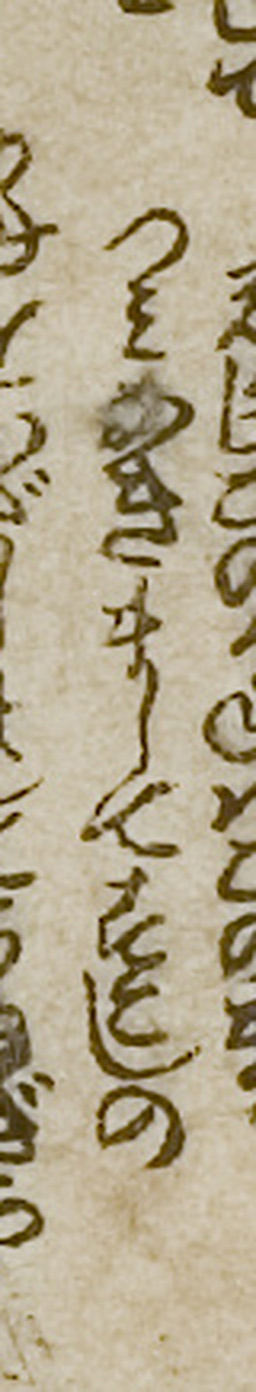かねをいだしましてうなぎや
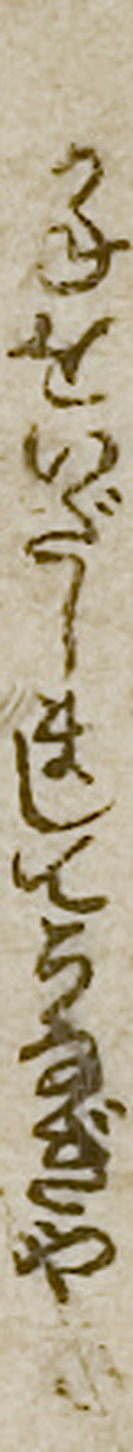かねをいだしましてうなぎや
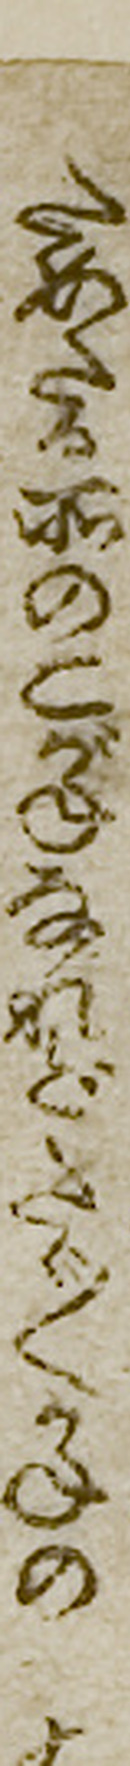ためたる所のこがねなれどたゞ〳〵かねの
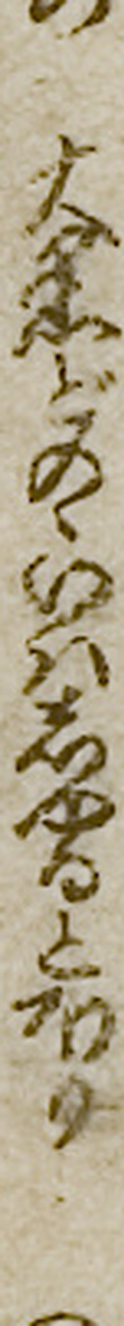大黒どのゝいはしやるとほり
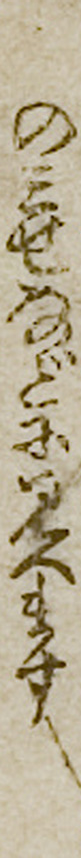のみせなどに見へます
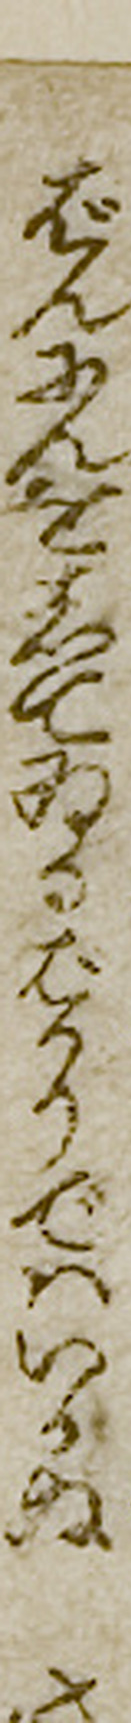ばんにんをしてゐるばかりではいかぬ
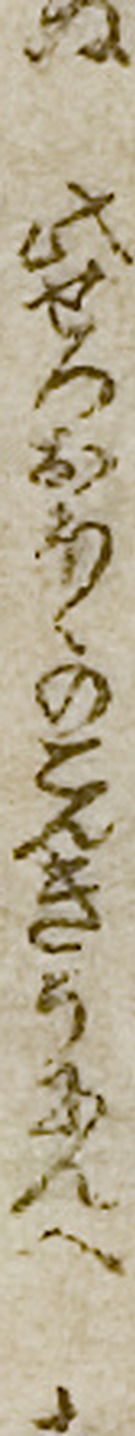此せつおほくのこんきうにんへ
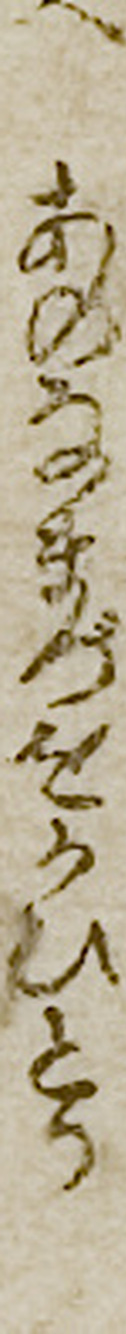あのなまづをかひとり
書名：[福助・恵比寿・大黒・閻魔の子 福神長者を諭す]
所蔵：東京大学総合図書館 General Library in the University of Tokyo, JAPAN
